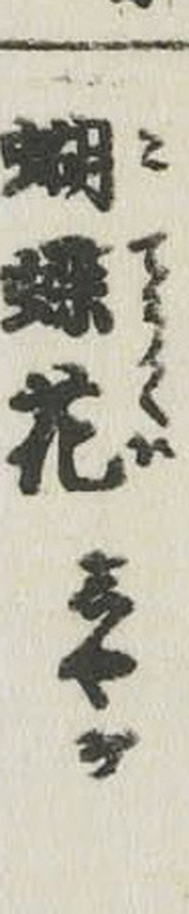蝴蝶花しやが
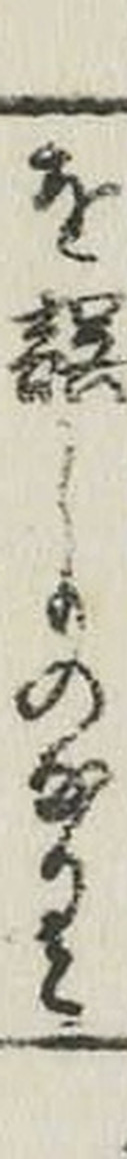を誤しものなりと
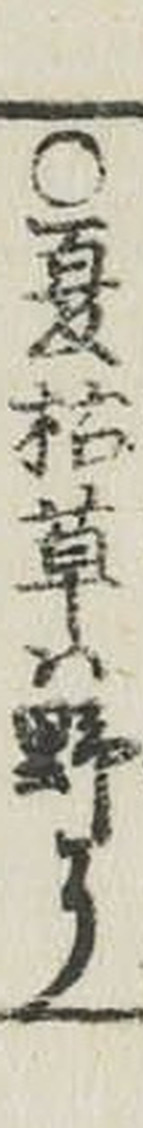○夏枯草は野に
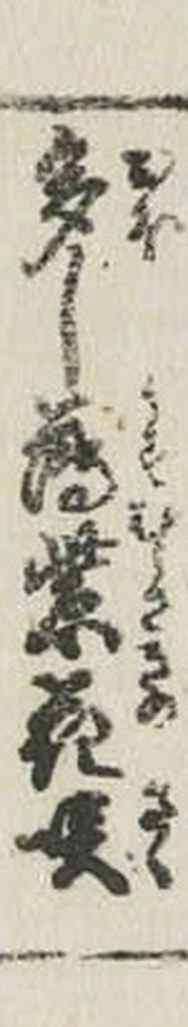多し薄紫花咲
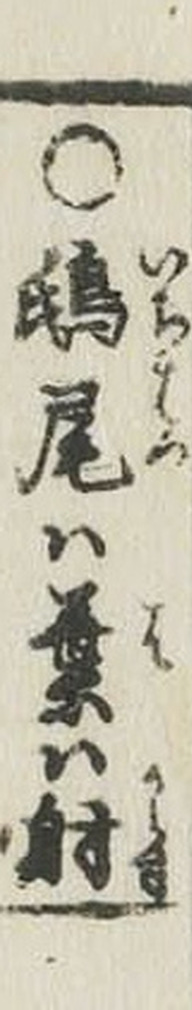○鴟尾は葉は射
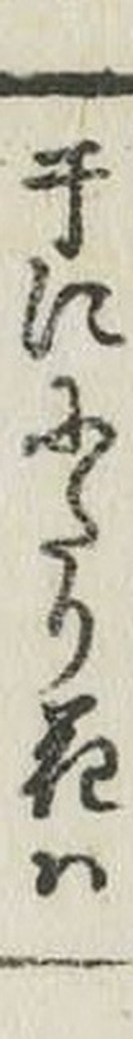干ににたり花は
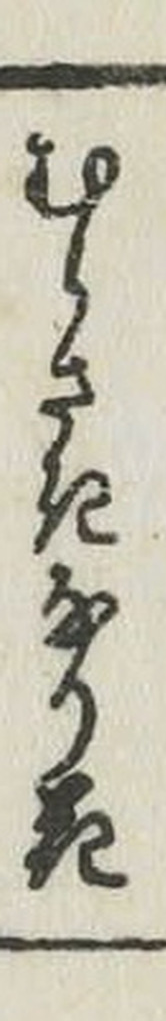むらさきなり花
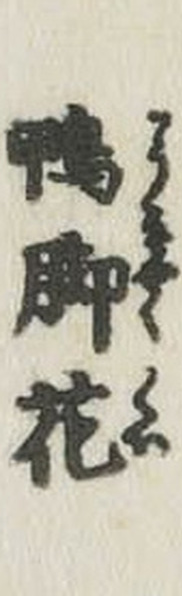鴨脚花
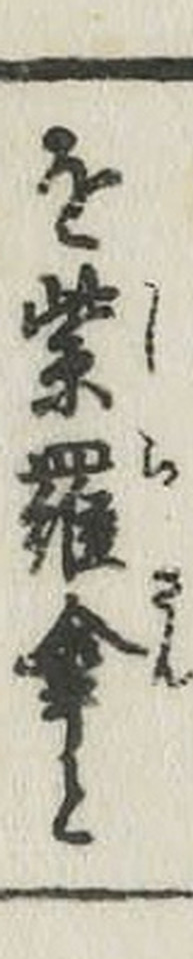を紫羅傘と
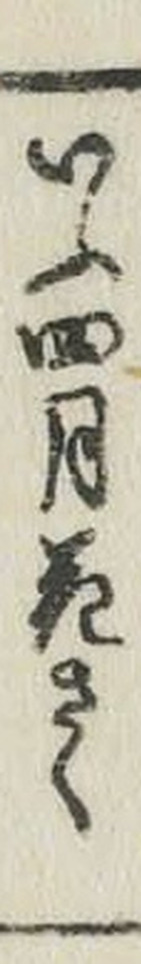いふ四月花さく
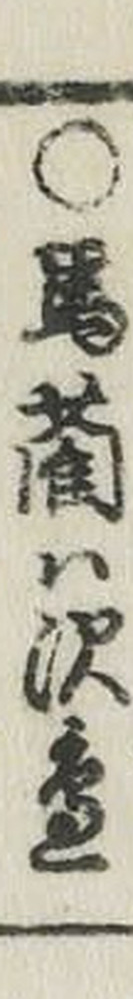○馬藺は沢辺
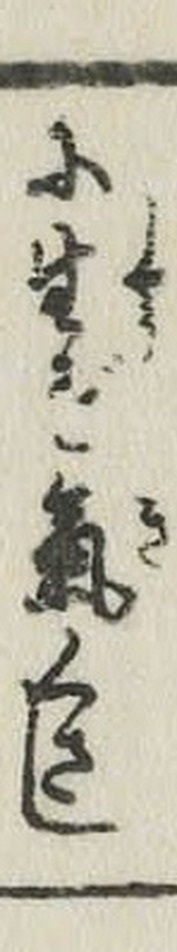に生ず気くさし
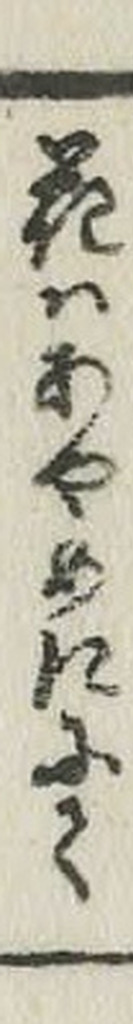花はあやめににて
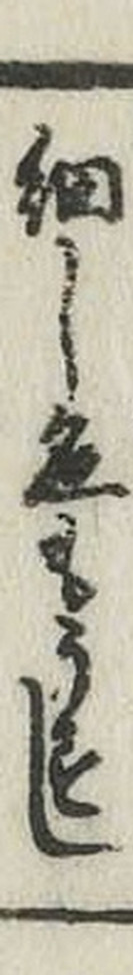細し色もうすし
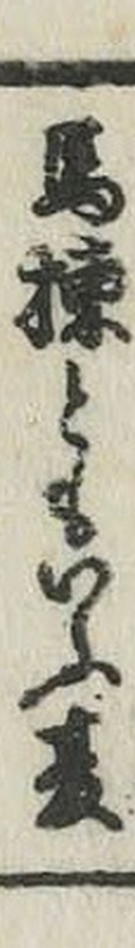馬棟ともいふ夏
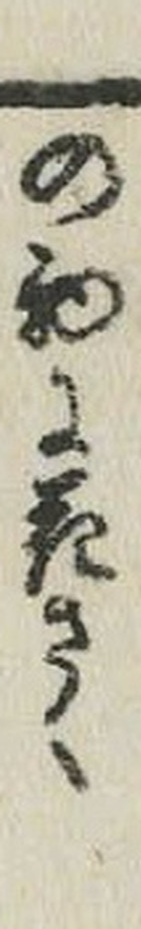の初に花さく
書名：増補頭書訓蒙図彙大成 10巻 9:巻之20
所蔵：東京学芸大学教育コンテンツアーカイブ
